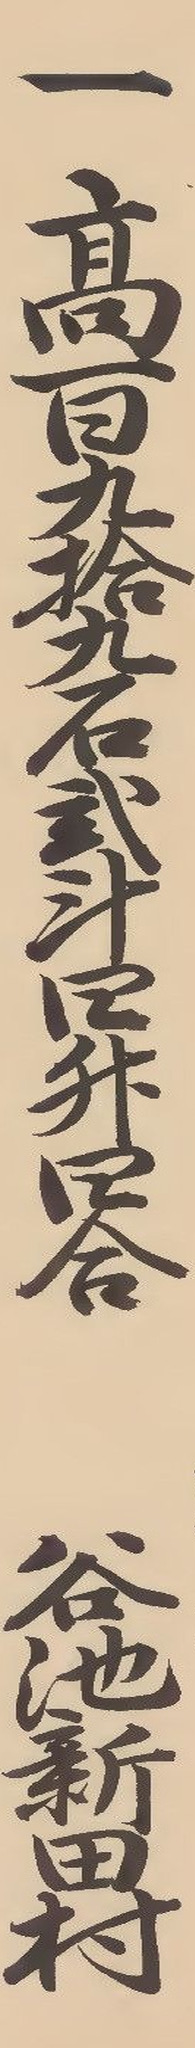一高百九拾九石弐斗四升四合谷池新田村
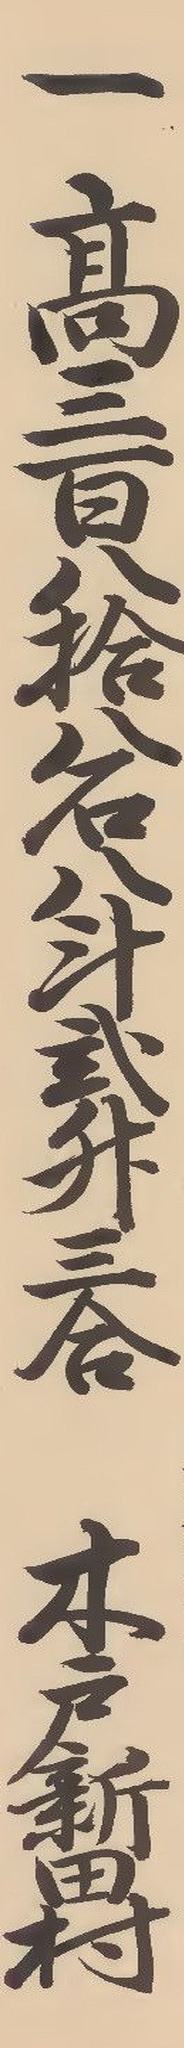一高三百八拾八石八斗弐升三合木戸新田村
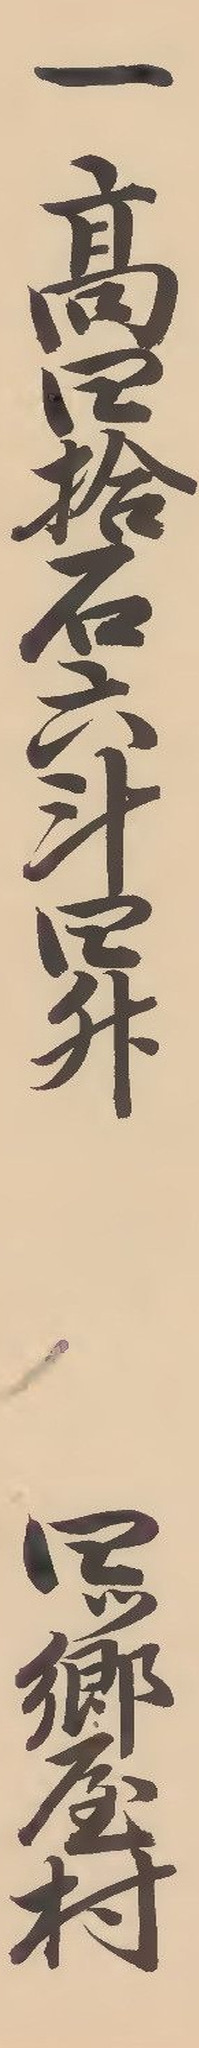一高四拾石六斗四升四ツ郷屋村

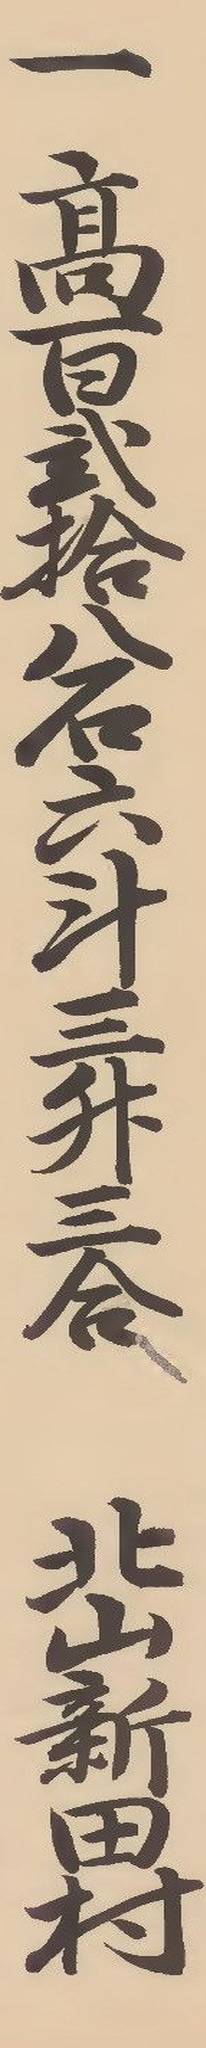一高百弐拾八石六斗三升三合北山新田村
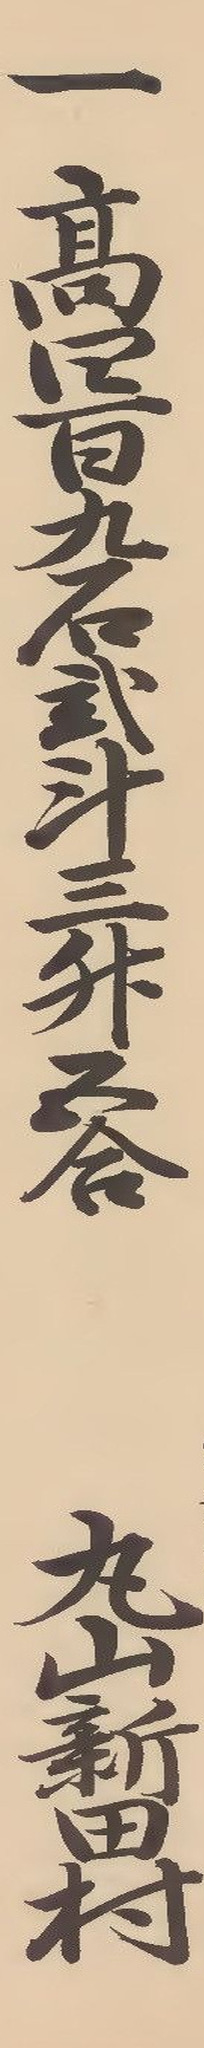一高四百九石弐斗三升五合丸山新田村
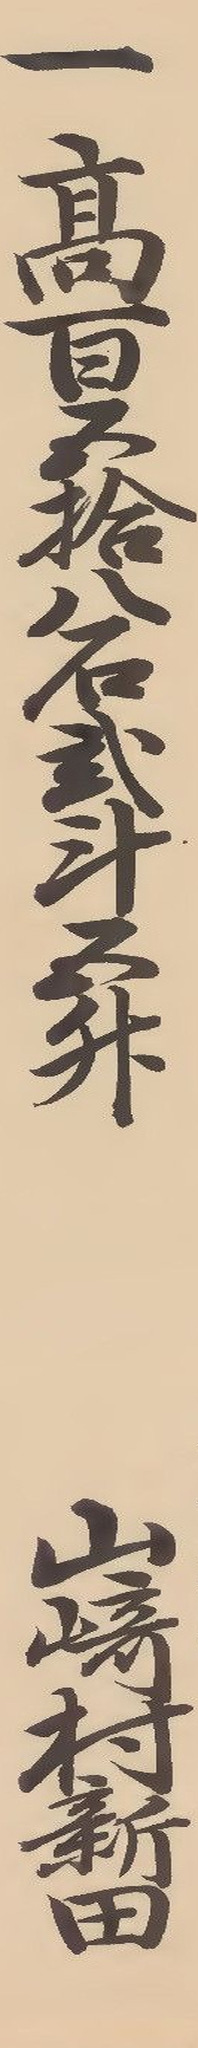一高百五拾八石弐斗五升山崎村新田
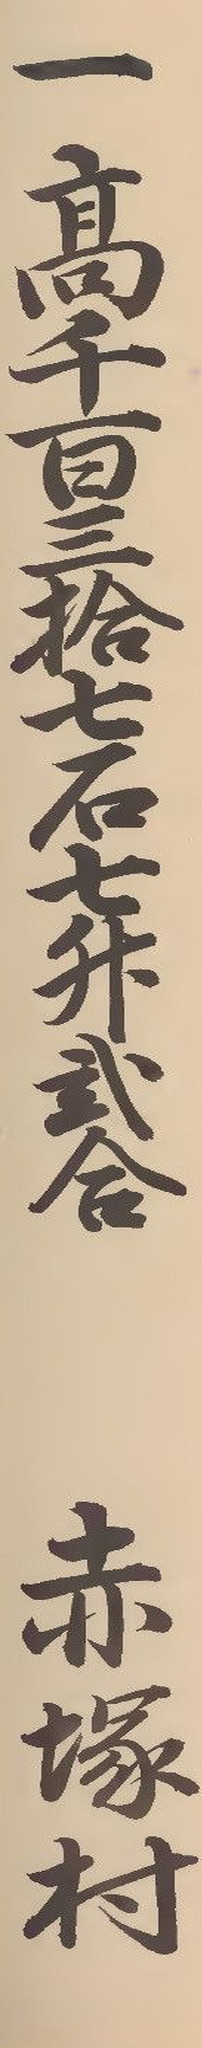一高千百三拾七石七升弐合赤塚村
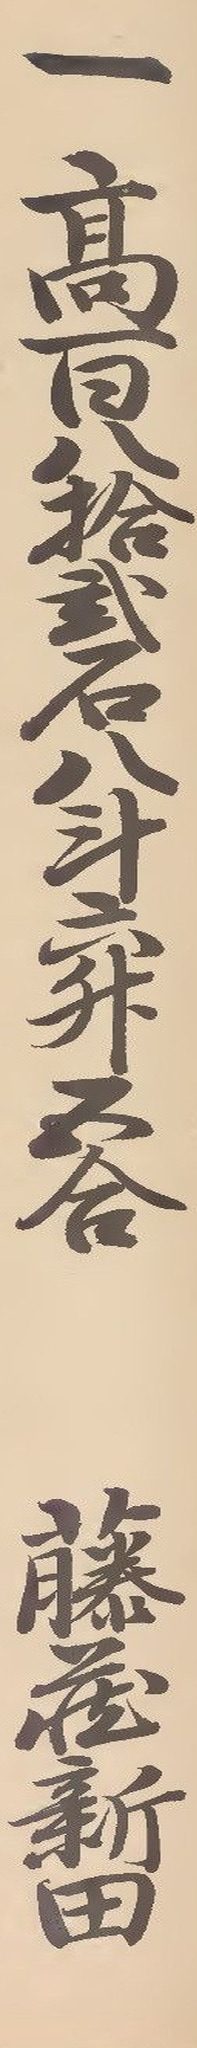一高百八拾弐石八斗六升五合藤蔵新田
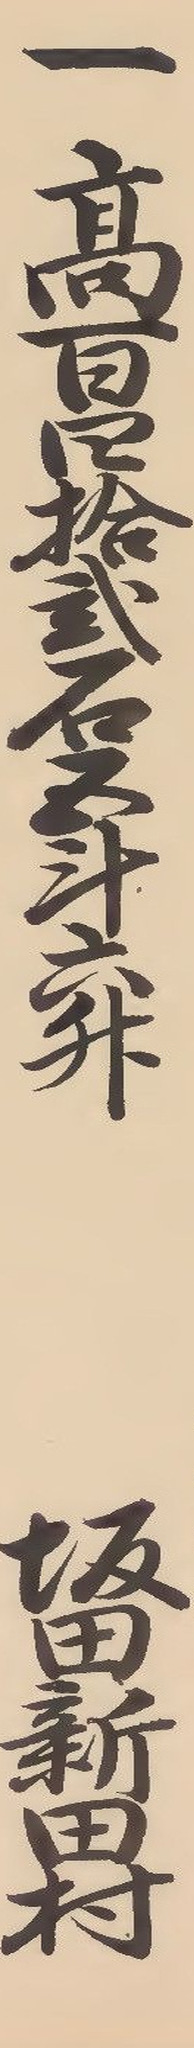一高百四拾弐石五斗六升坂田新田村
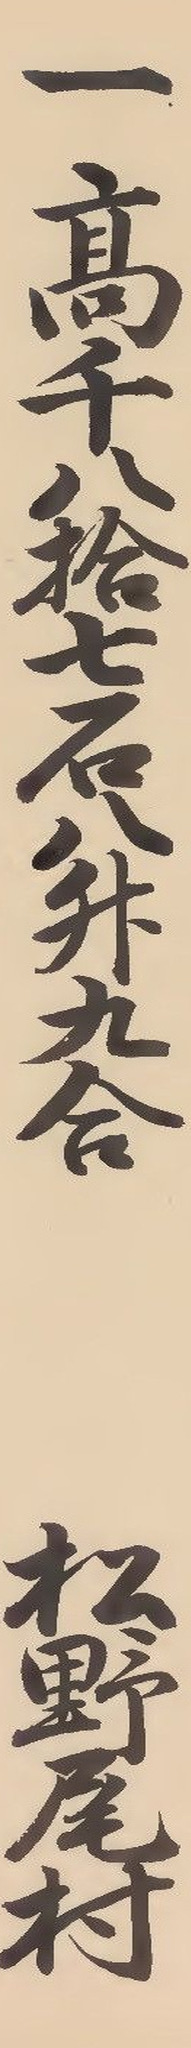一高千八拾七石八升九合松野尾村

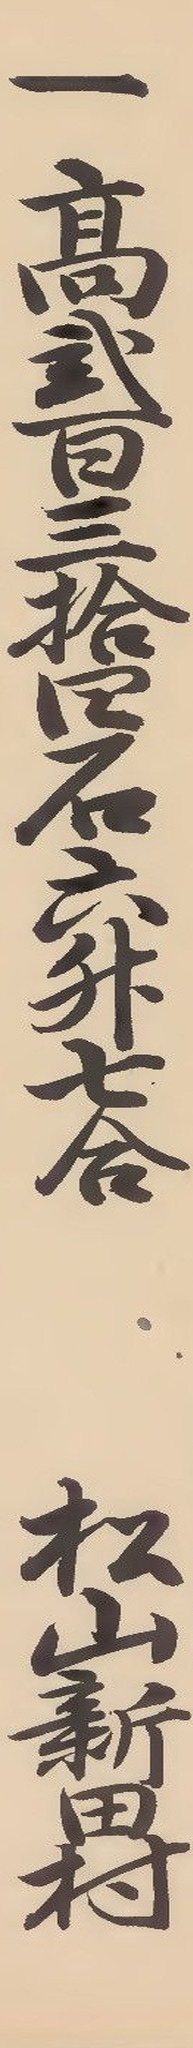一高弐百三拾四石六升七合松山新田村
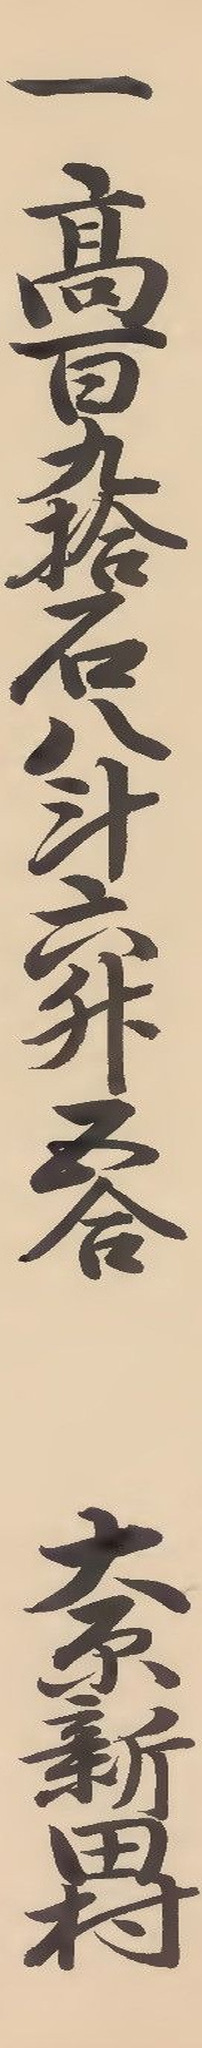一高百九拾石八斗六升五合大原新田村
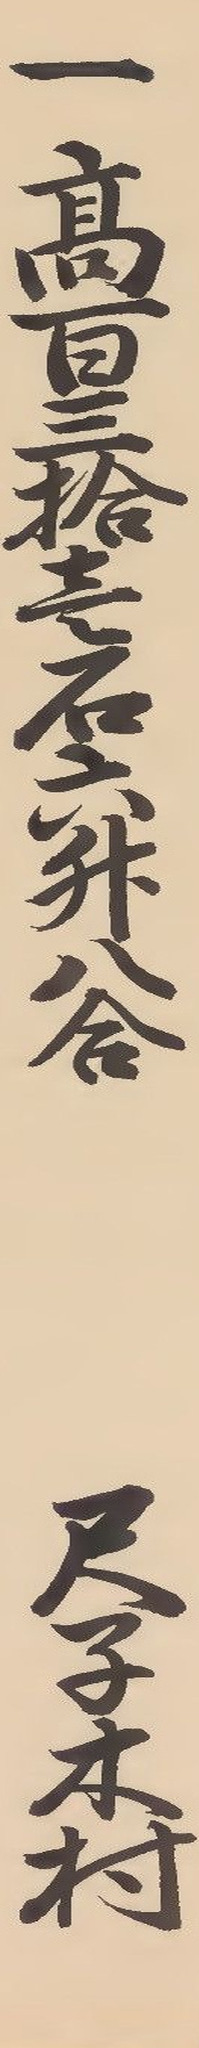一高百三拾壱石六升八合尺子木村
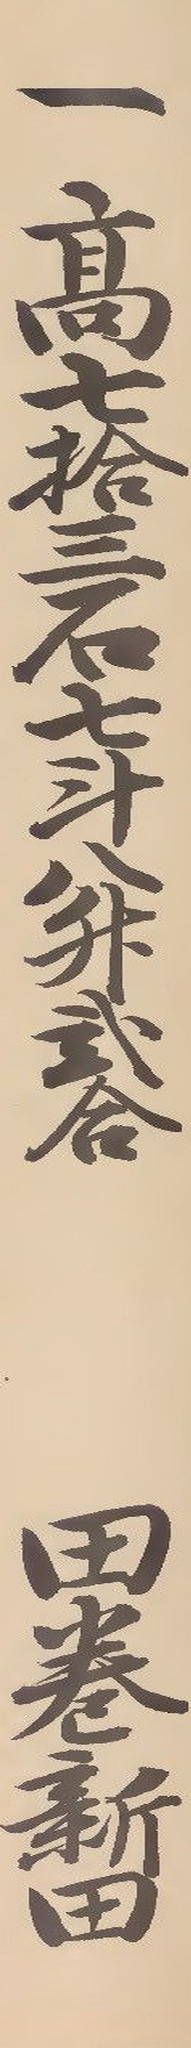一高七拾三石七斗八升弐合田巻新田
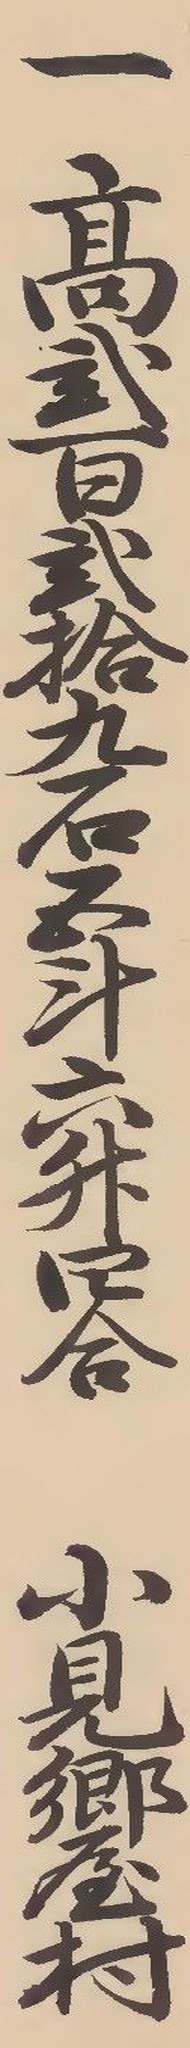一高弐百弐拾九石五斗六升四合小見郷屋村
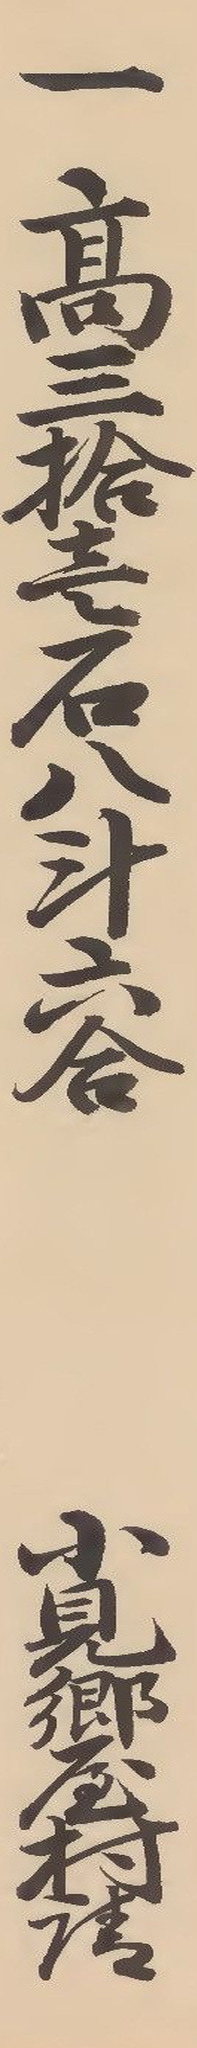一高三拾壱石八斗六合小見郷屋村請
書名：越後国郷帳　下
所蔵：国立公文書館 National Archives of Japan
